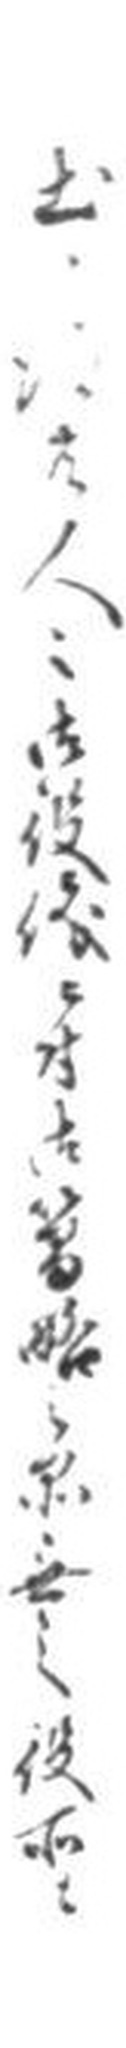出候得共人々御役儀ニ付御簡略之品無之役所ニ
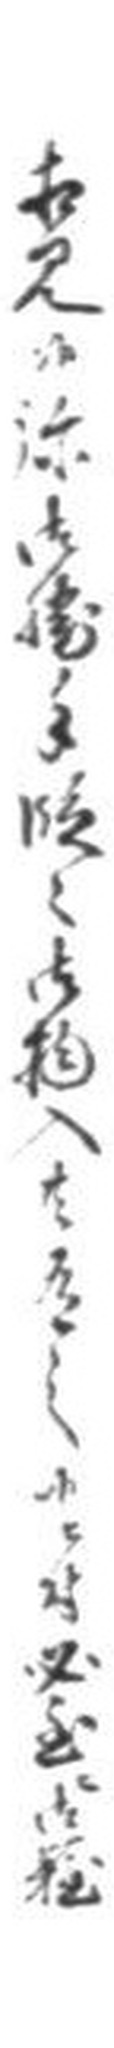相見候弥御勝手段々御物入共有之候ニ付必至ニ御極
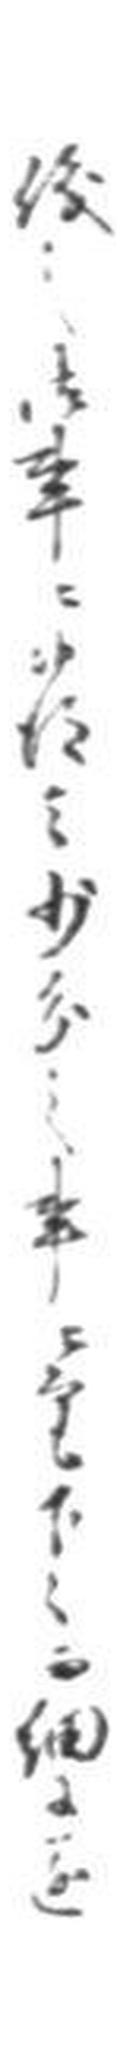儀之御事ニ候得は少分之事ニ而も下々而細に遂
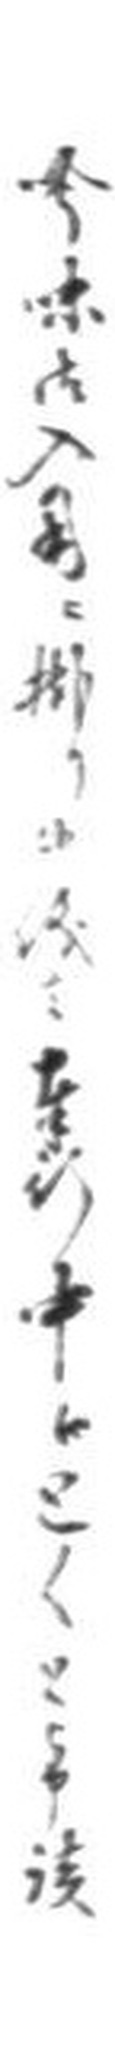吟味御入用ニ掛り候儀は奉行中江とくと被申談
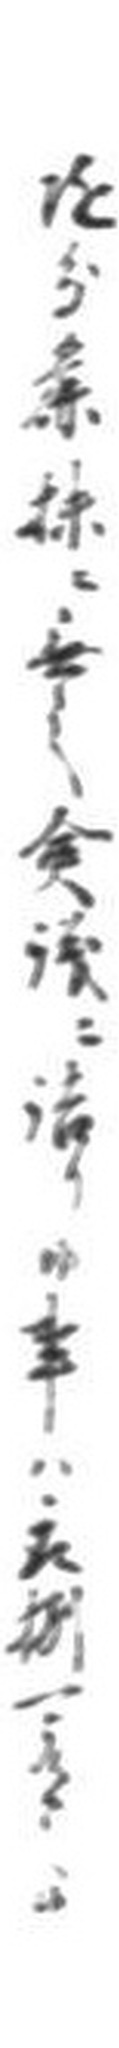随分麁抹ニ無之僉議ニ詰り候事ハ取捌可有之候
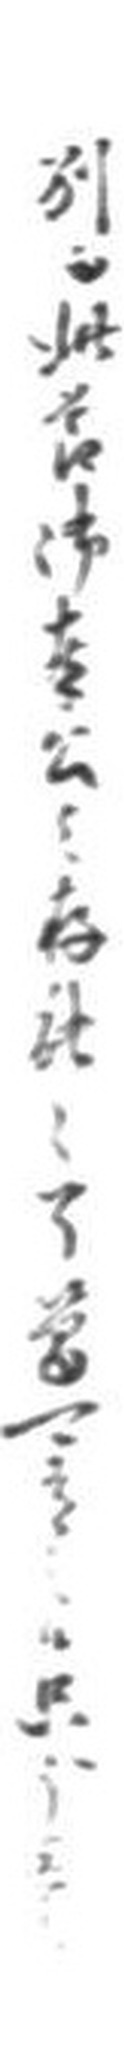別而此節御奉公は存能々了簡可有之候只今度之
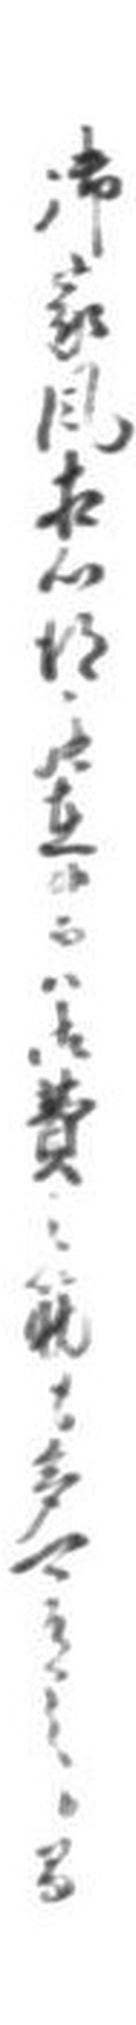御家風相心得罷在候而ハ御費之筋も多可有之候間
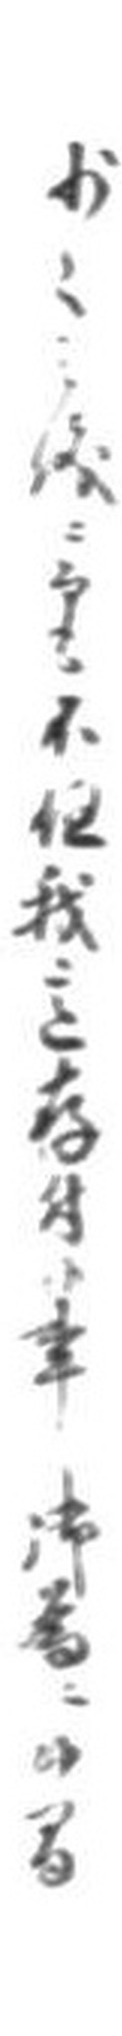少々之儀ニ而も不任我意存付候事御為ニ候間
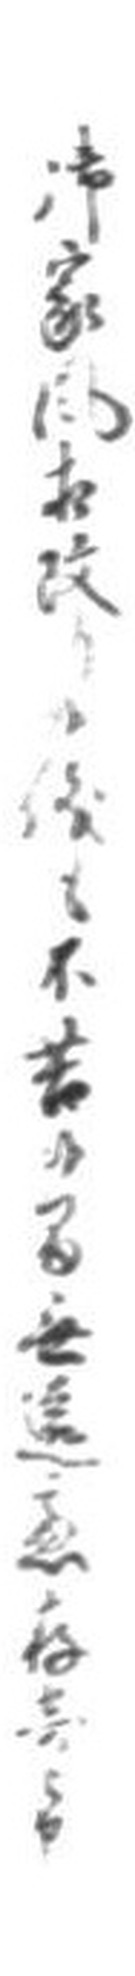御家風相改り候儀も不苦候間無遠慮存寄被申
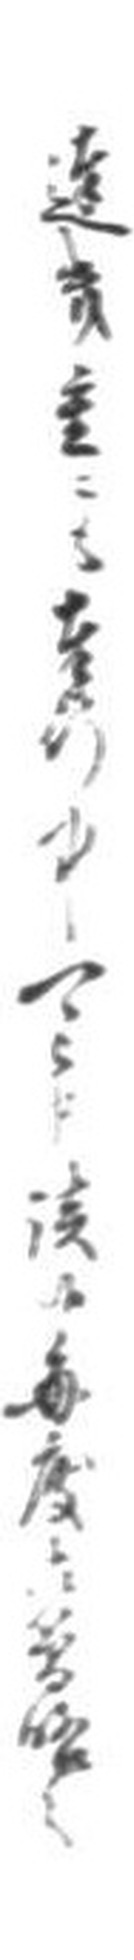達幾重にも奉行中可被申談候毎度御簡略之
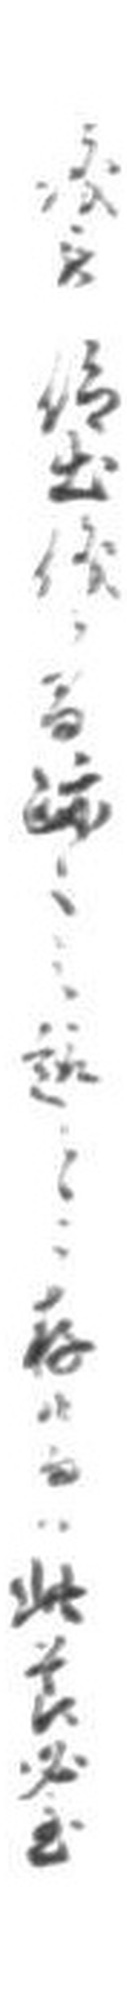儀被仰出儀候間跡々之趣こゝニ存候而ハ此節必至
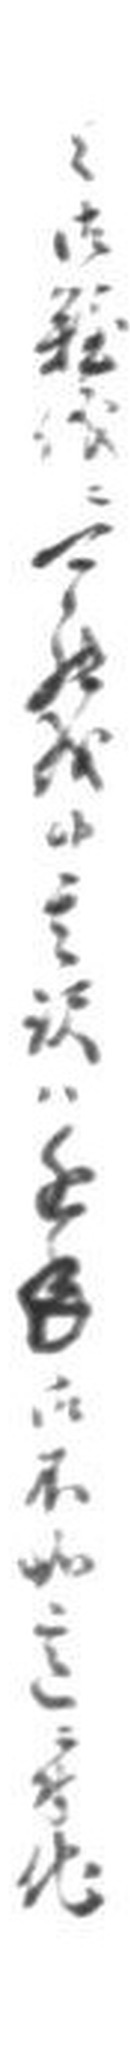之御難儀ニ可罷成候其訳ハ近年御不如意ニ付他
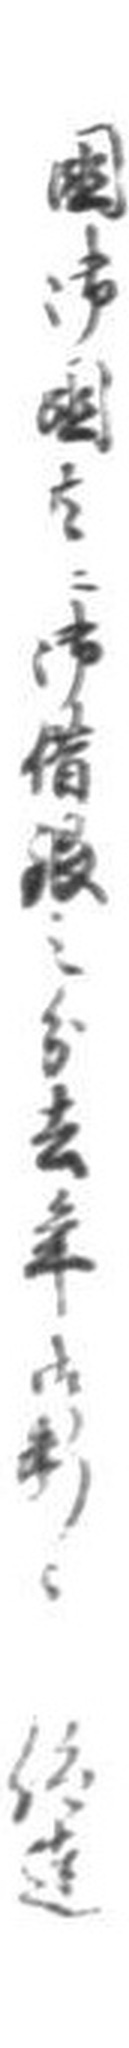国御国共ニ御借銀之分去年御断ニ仰達

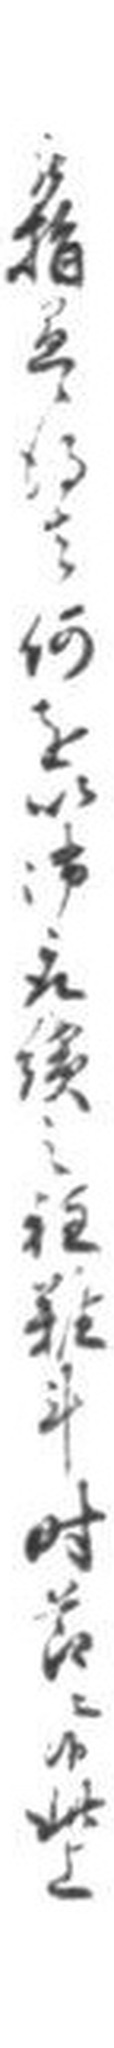被指置候得共何を以御取続之程難斗時節ニ候此上
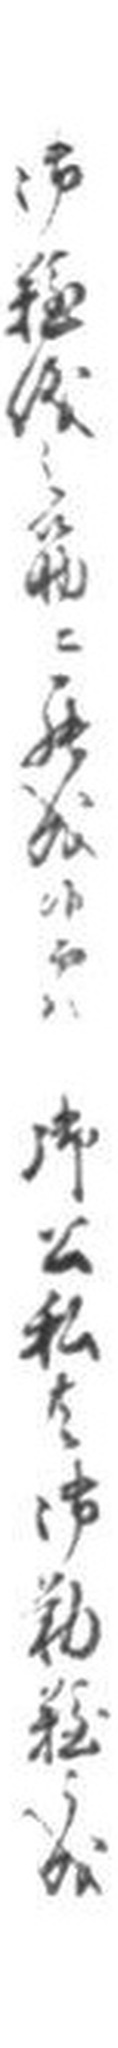御難儀之筋ニ罷成候而ハ御公私共御勤難可成
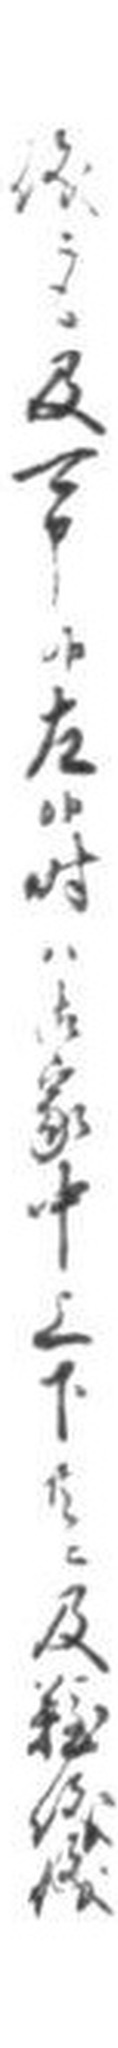儀かも及可申候左候時ハ御家中上下共ニ及難儀儀
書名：家譜 三十九 宗矩公 享保十年
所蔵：福井県文書館 Fukui Prefectural Archives
